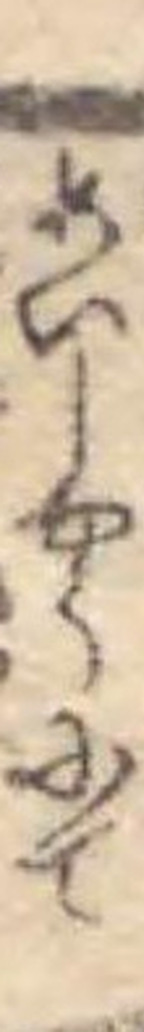めいしやうにて
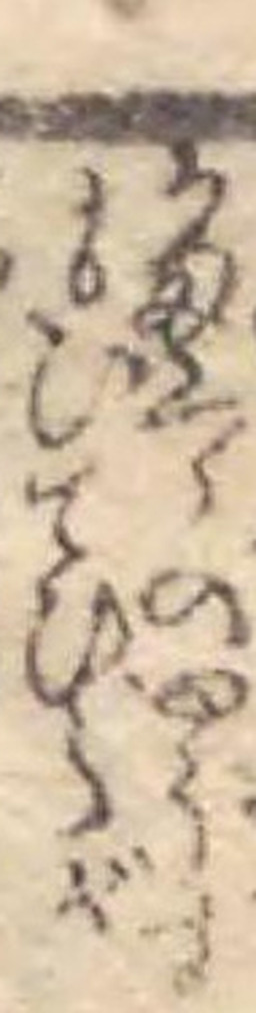もひてひらが
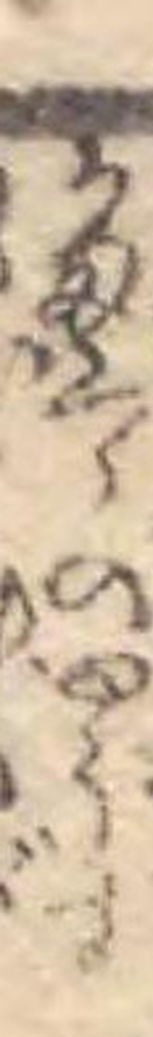かまくらのやうす
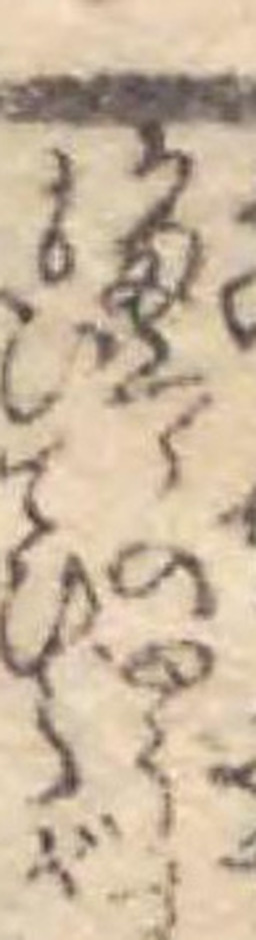もひてひらが
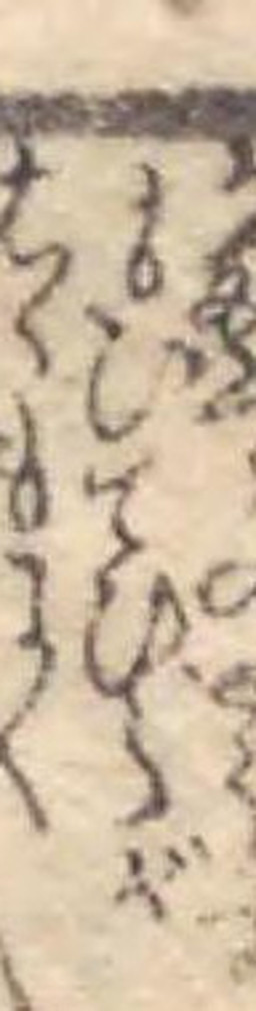はらもよく
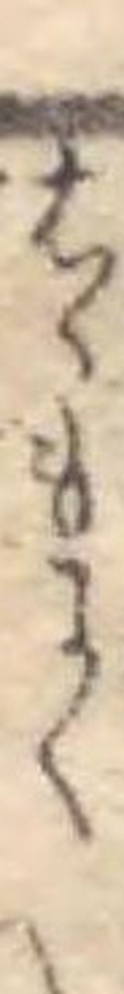はらもよく
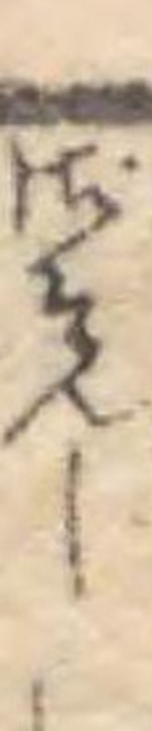御そんし
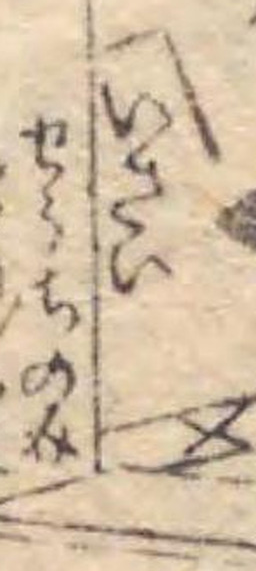せうちの介
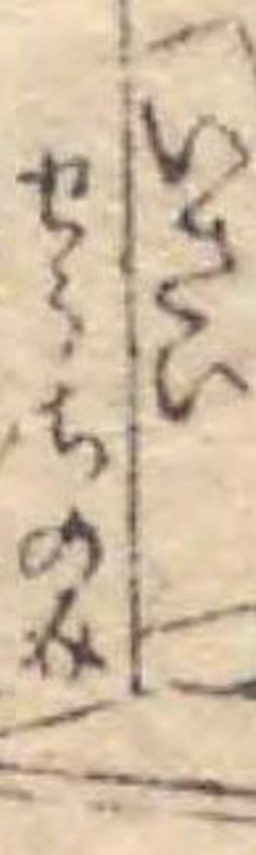せうちの介
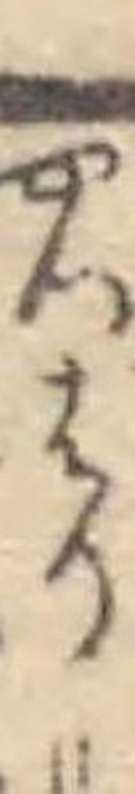やつはり
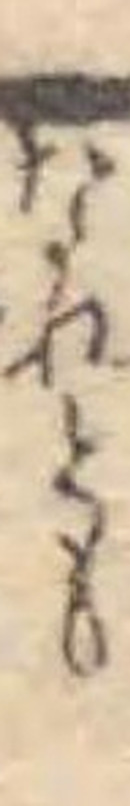なれとも
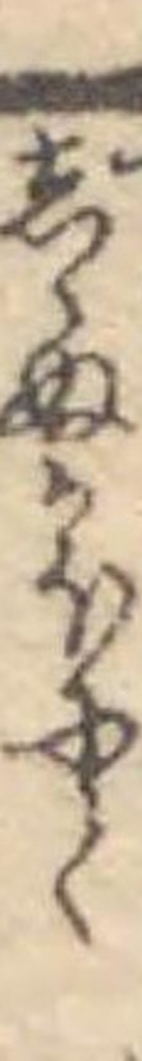しらぬかほにて
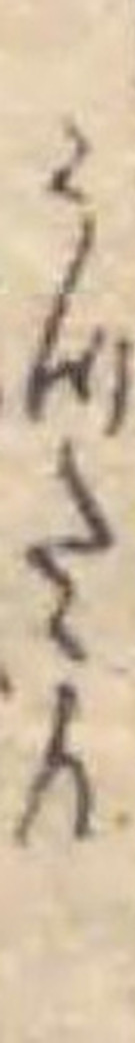うつたゝん
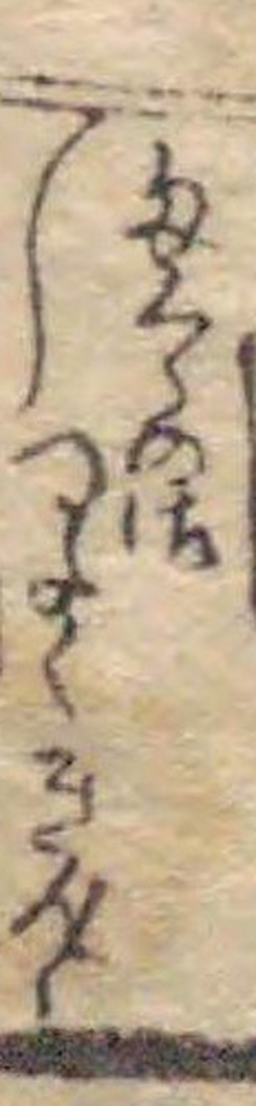つよくきん〳〵
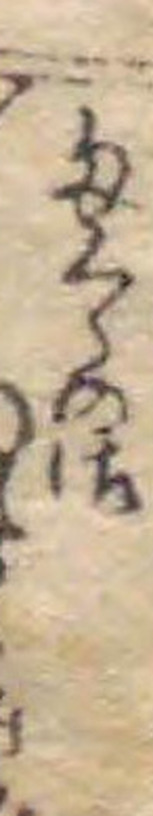まくらの御
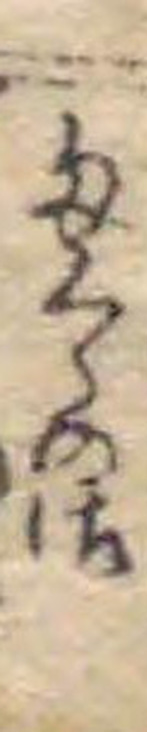まくらの御
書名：悦贔負蝦夷押領 : 3巻
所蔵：国立国会図書館 National Diet Library, JAPAN
